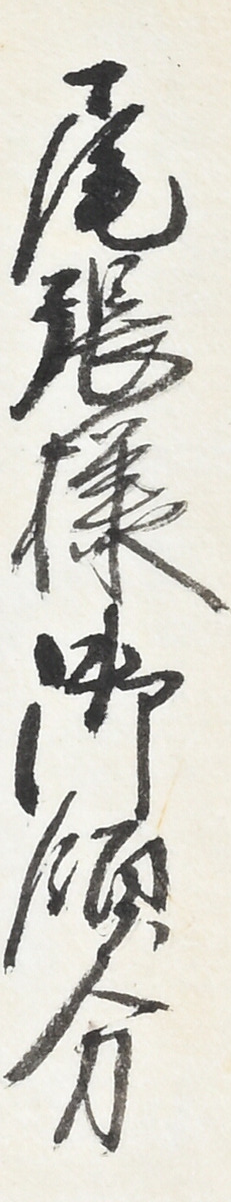尾張様御領分
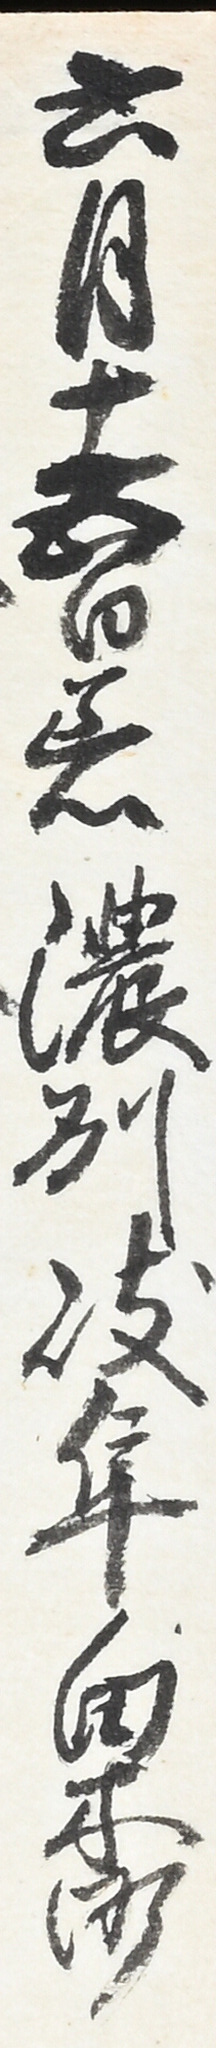六月十五日着濃州岐阜白木町
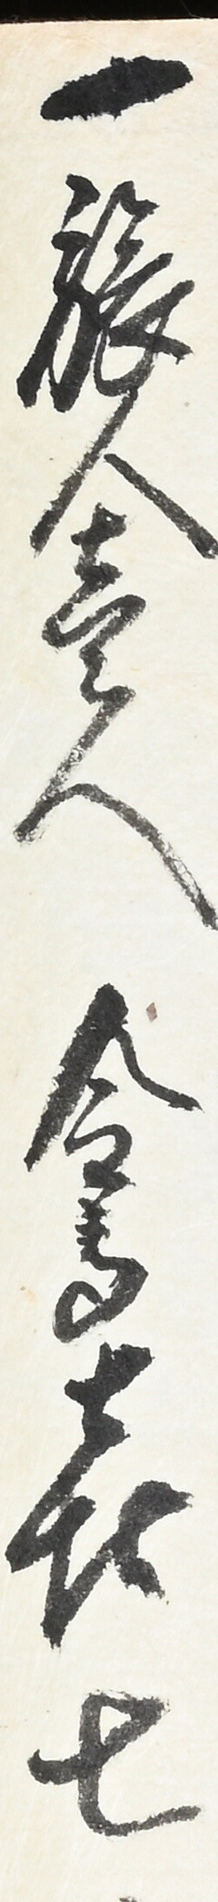一旅人壱人金高喜七・
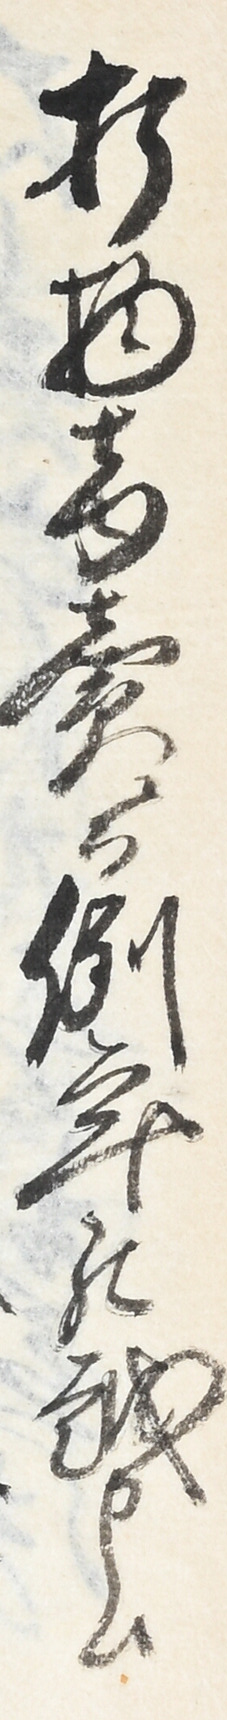小間物商売ニ而例年罷越申候
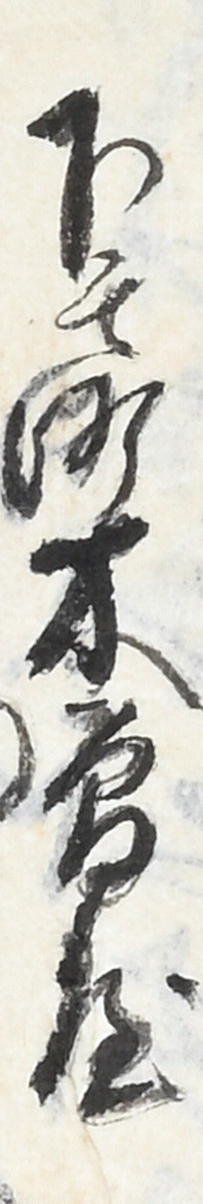下モ町木曽屋
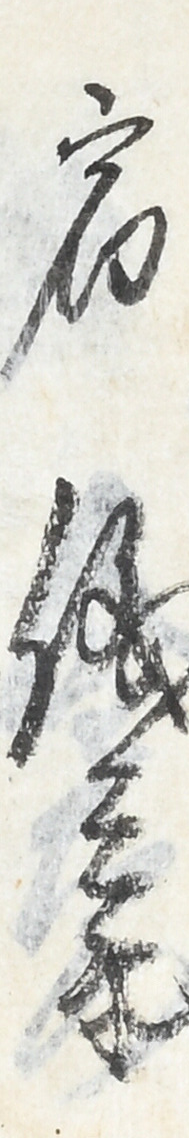宿儀兵衛
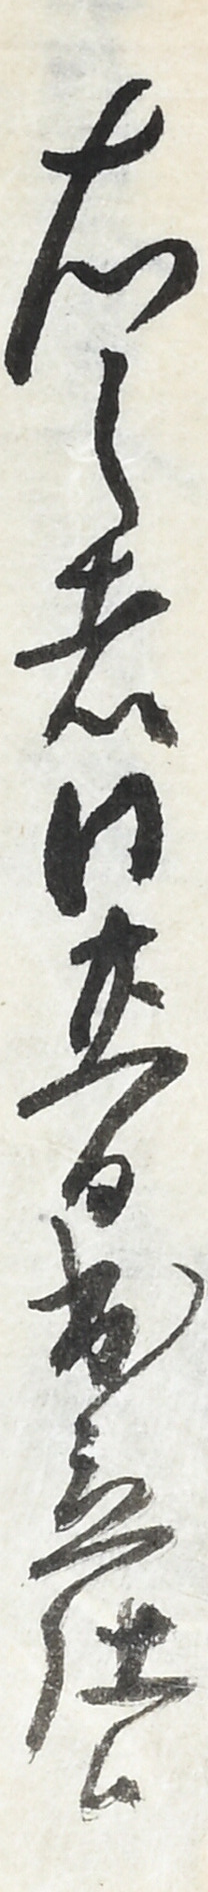右之者同廿一日出立仕候

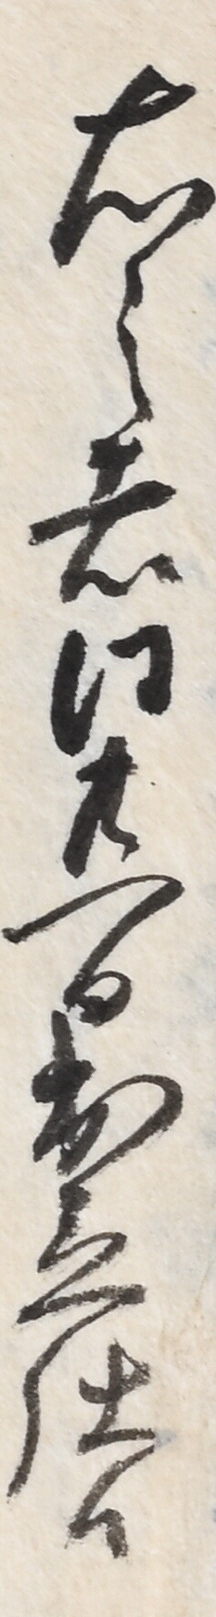右之者同廿一日出立仕候
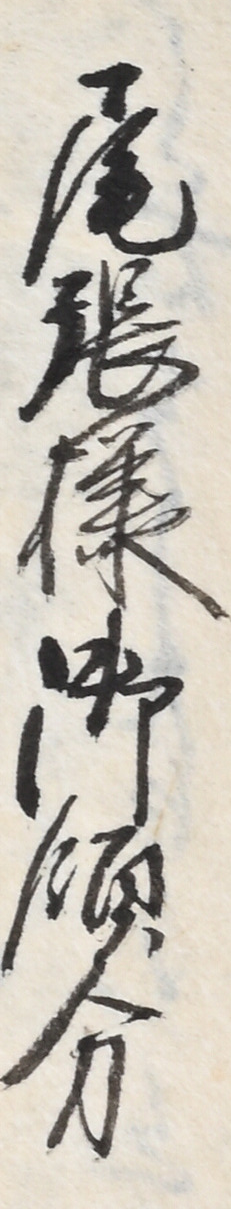尾張様御領分
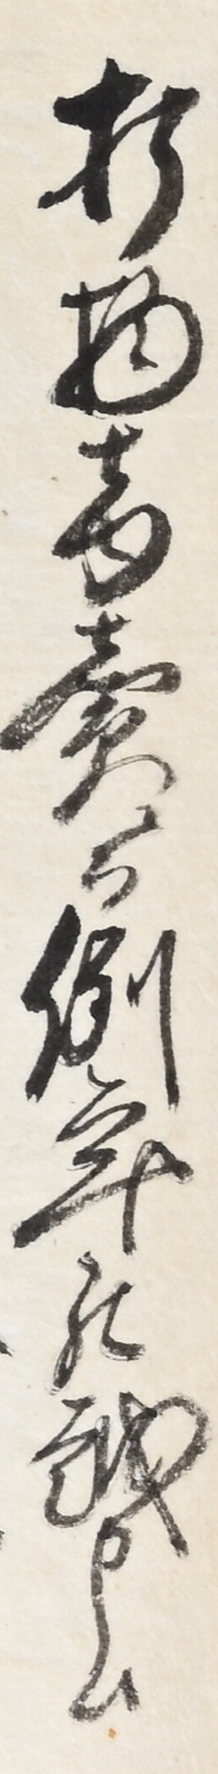打物商売ニ而例年罷越申候
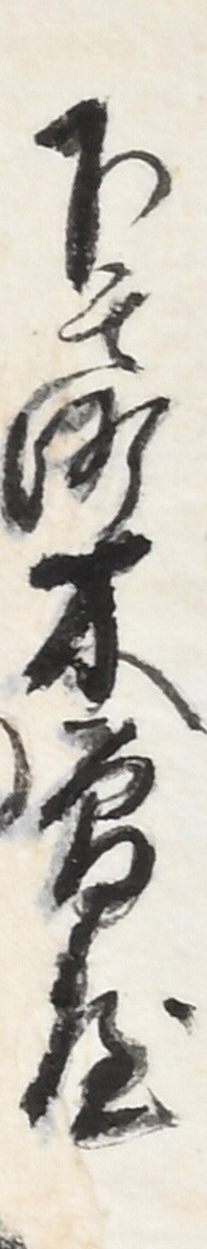下モ町木曽屋
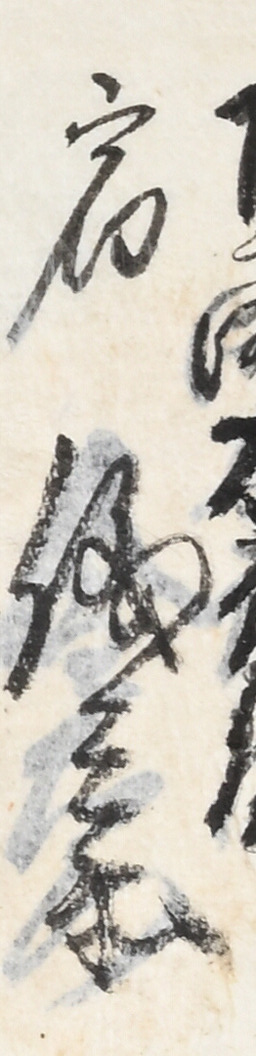宿儀兵衛
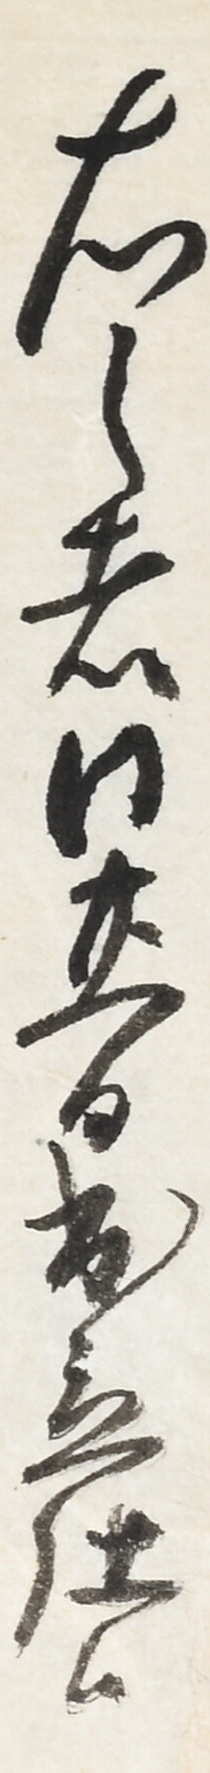右之者同廿一日出立仕候
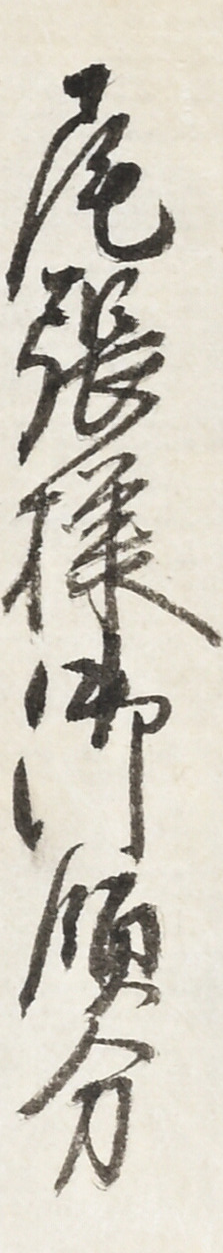尾張様御領分
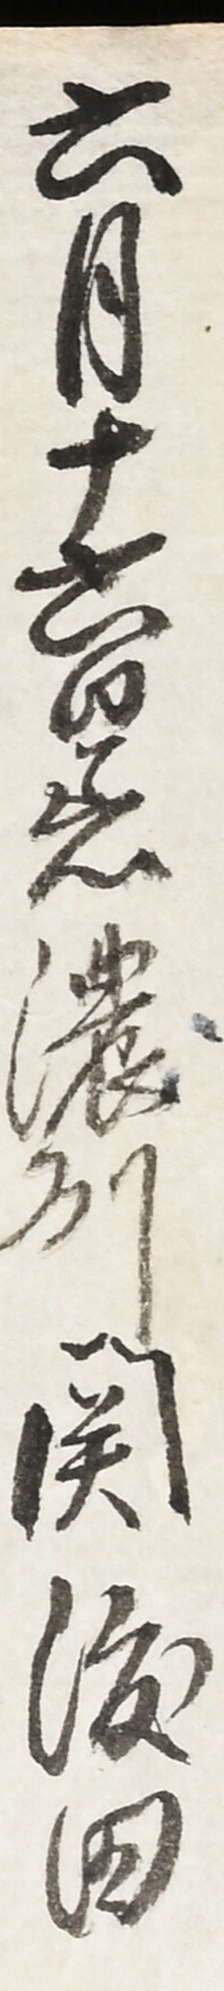六月十六日着濃州関渡田
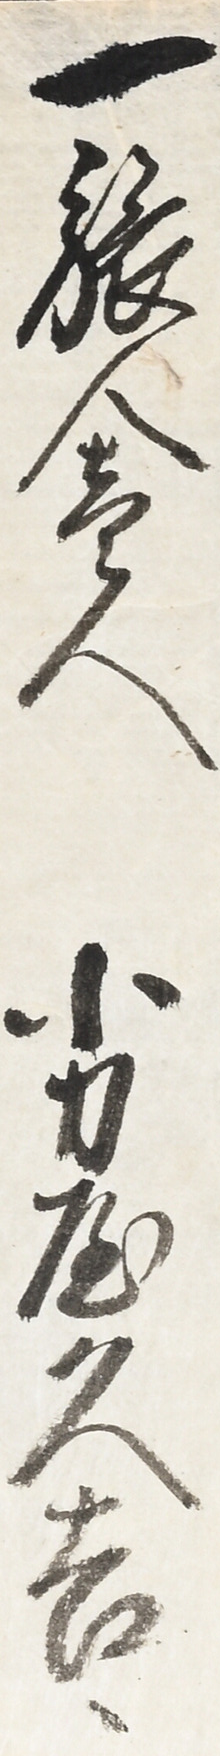一旅人壱人小力屋久吉・
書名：旅人泊控帳
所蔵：伊那市立高遠町図書館・合同会社AMANE
